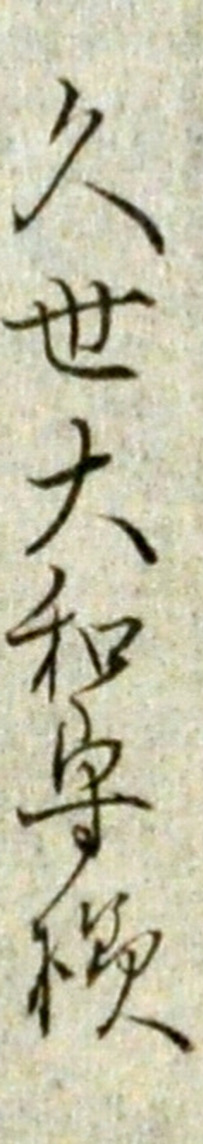久世大和守様
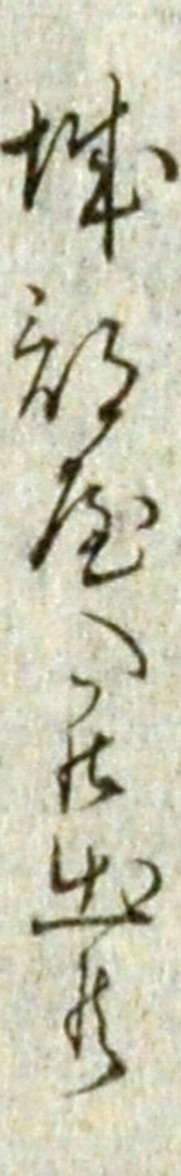城部屋へ罷出候
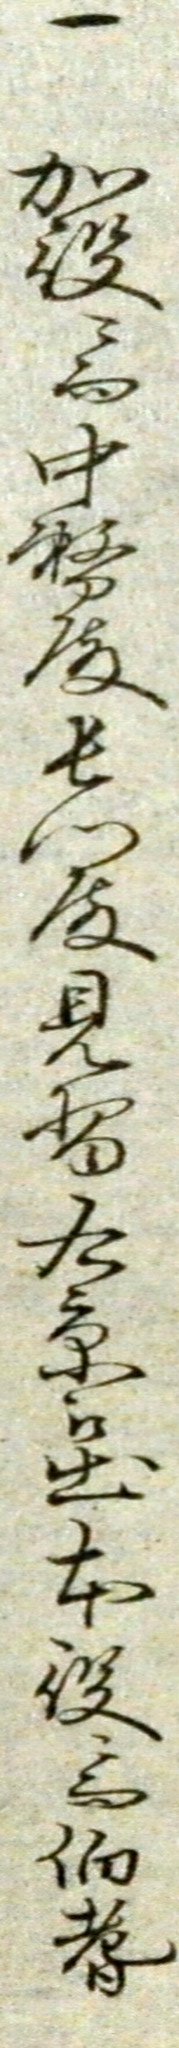一加役ニ而中務殿長門殿見習右京被出本役ニ而伯耆
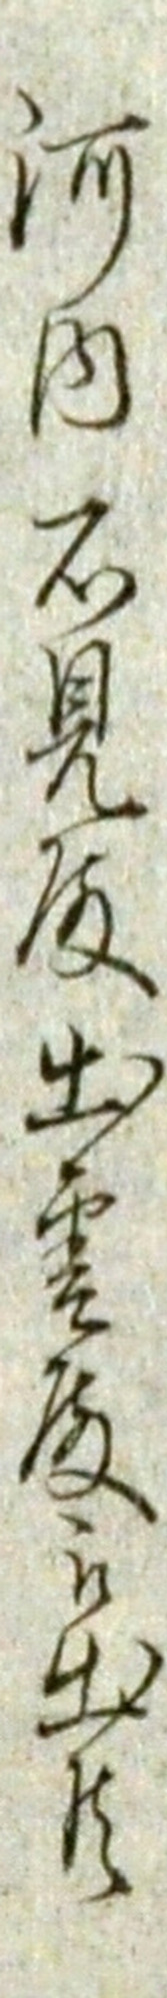河内石見殿出雲殿被出候

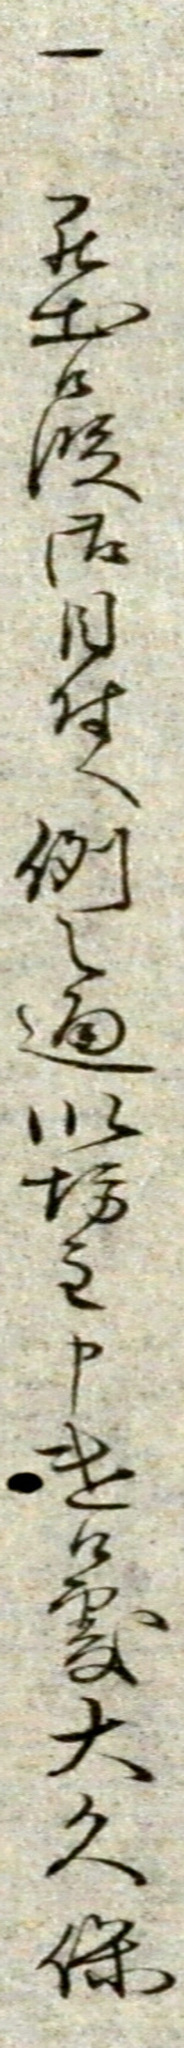一罷出候段御目付へ例之通以坊主申遣候処大久保
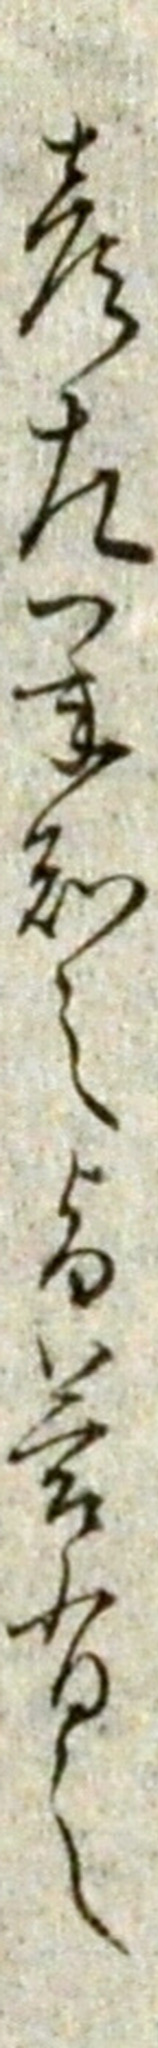彦左承知之旨答有之
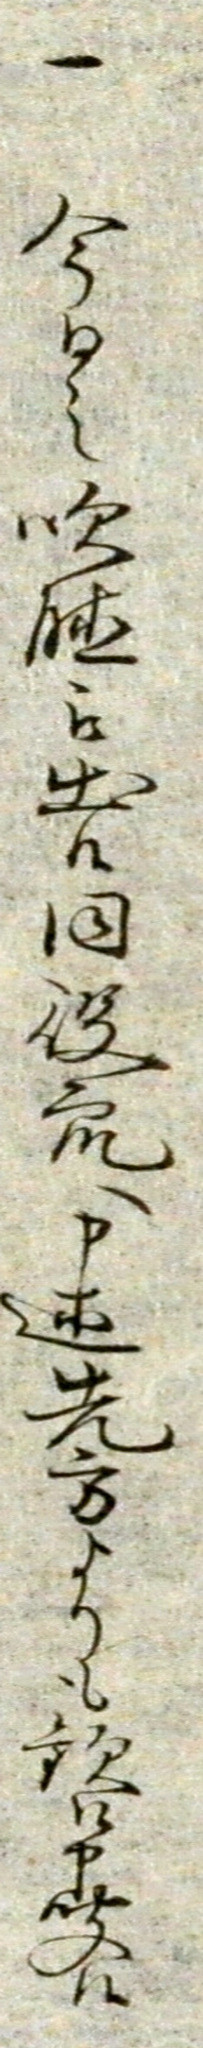一今日之吹聴被出候同役衆へ申述先方よりも歎被申聞候
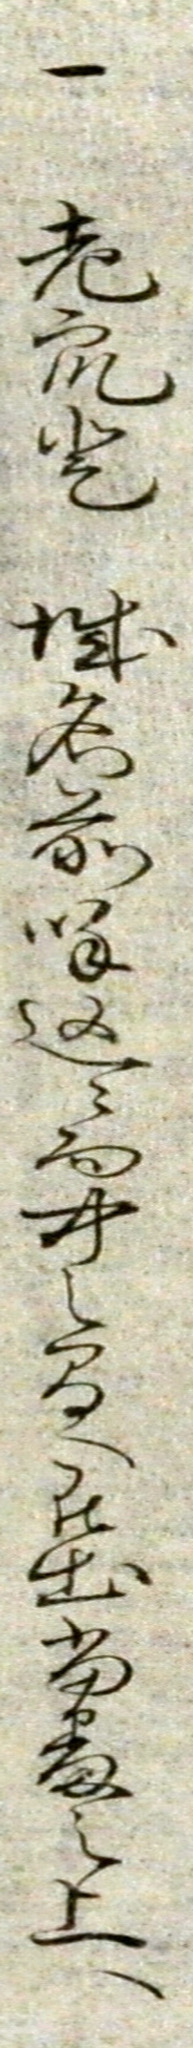一老衆登城名前呼込ニ而中之間へ罷出当番之上へ
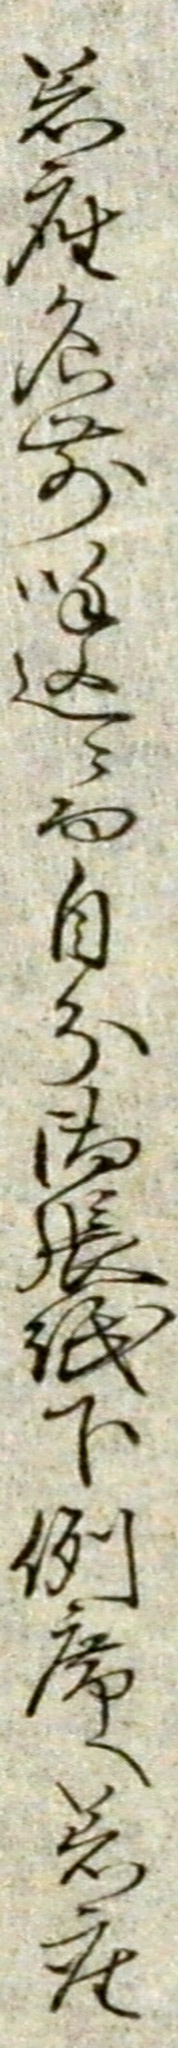着座名前呼込ニ而自分御張紙下例席へ着座
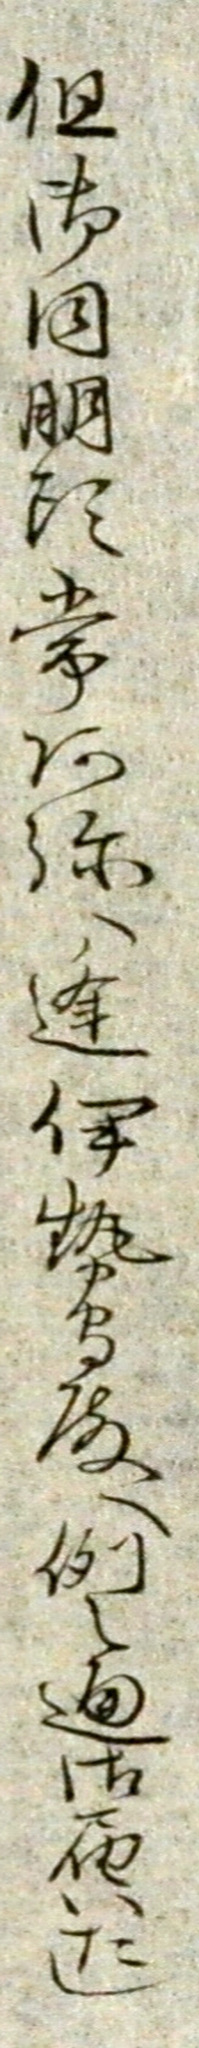但御同朋頭常阿弥へ逢伊勢守殿へ例之通御届いたし
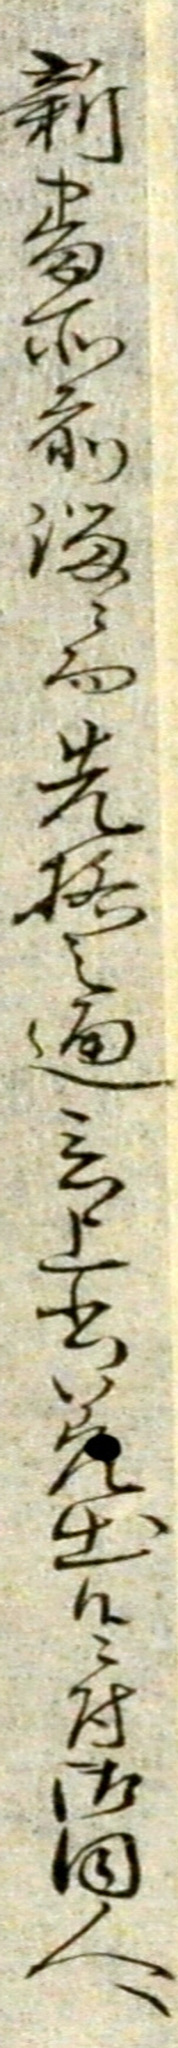新番所前溜ニ而先格之通言上書差出候ニ付御用人へ
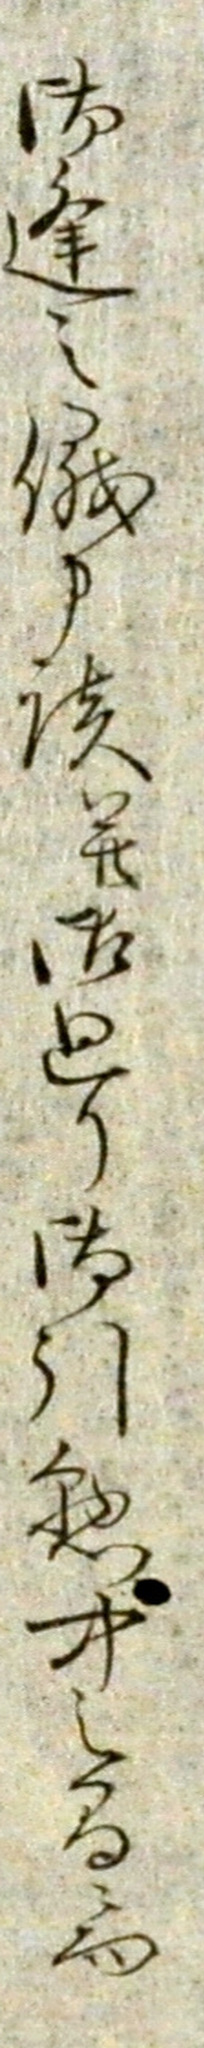御逢之儀申談幷御廻り御引懸中之間ニ而
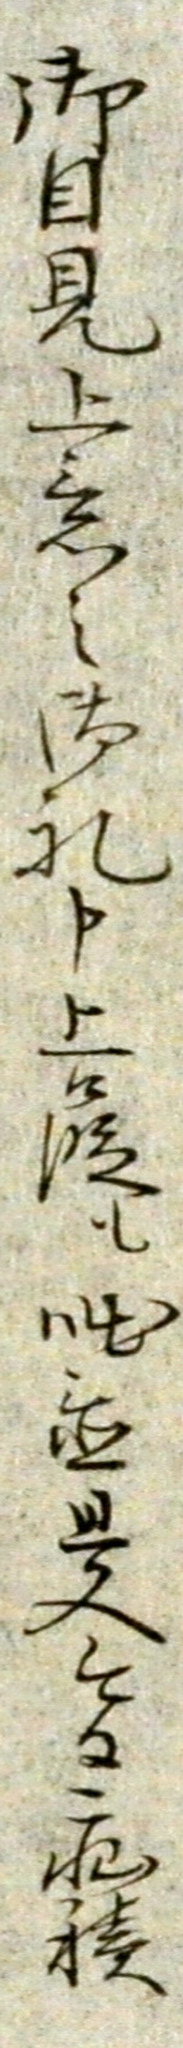御目見上意之御礼申上候段も咄置且又今日疝積
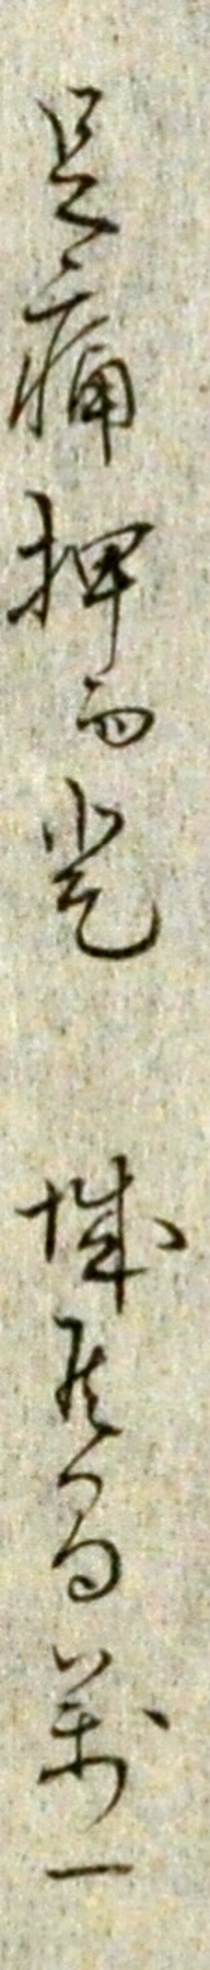足痛押而登城候間万一
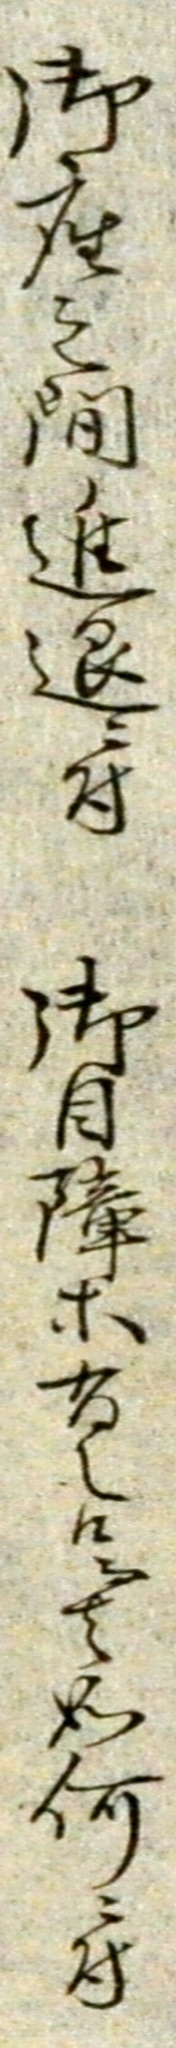御座之間進退ニ付御目障等有之候而者如何ニ付
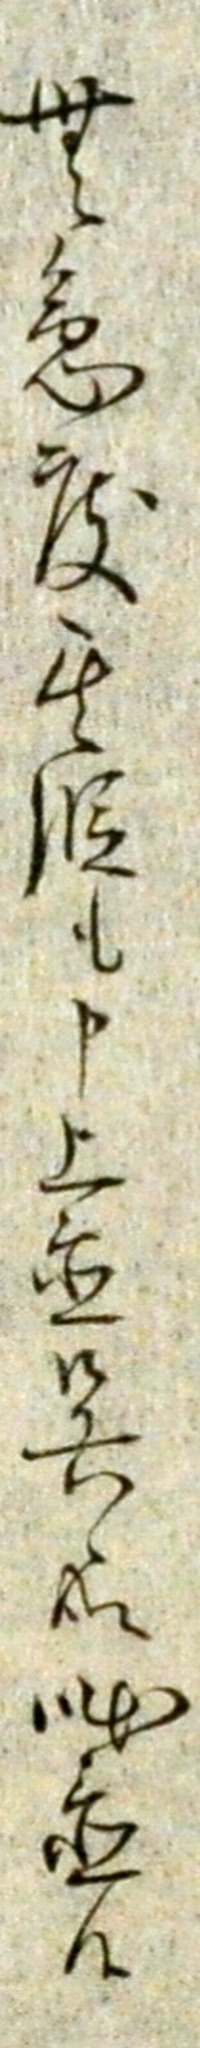無急度其段も申上置候右様咄置候
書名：日光御名代相勤候節ノ留
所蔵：伊那市立高遠町図書館・合同会社AMANE
